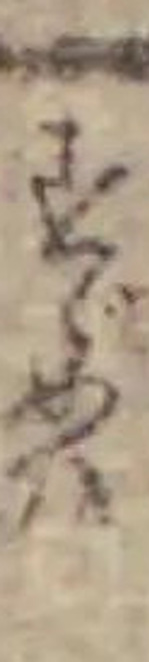すゞめは
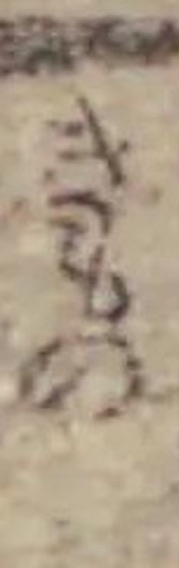きもの
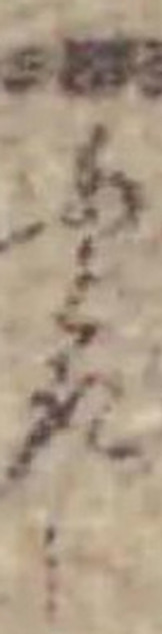ふとき
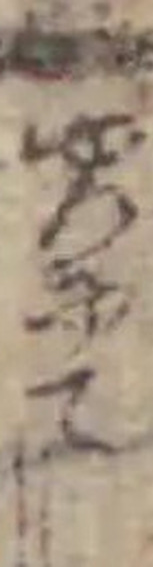やつにて
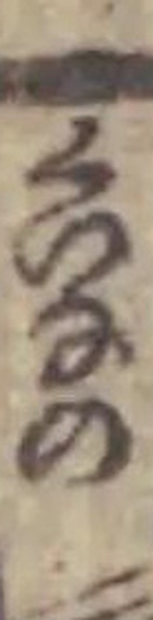くいなの
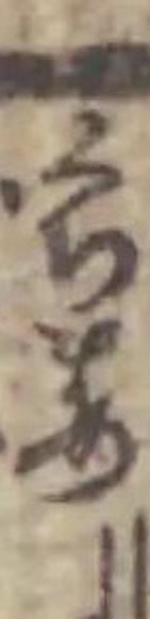くちまめ
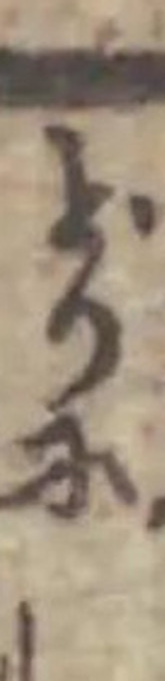どりに
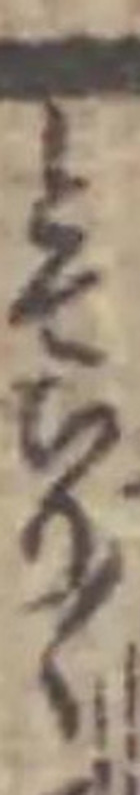とてちり〳〵
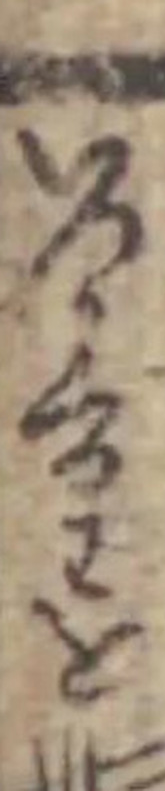いつかくるわを
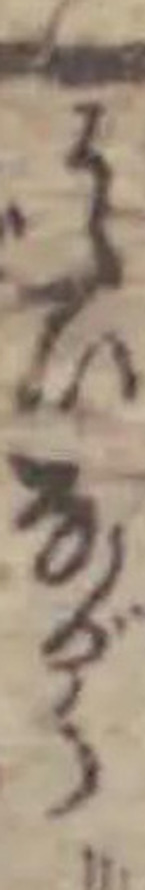うたひながら
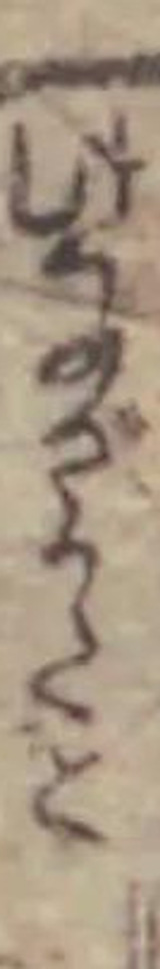此ながうたを
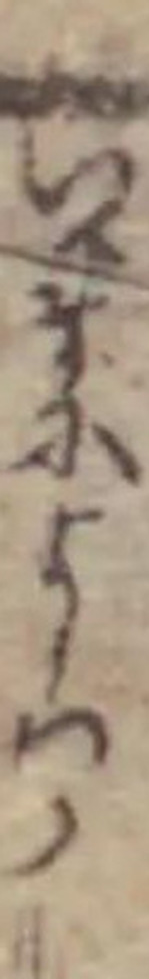いまによしはら
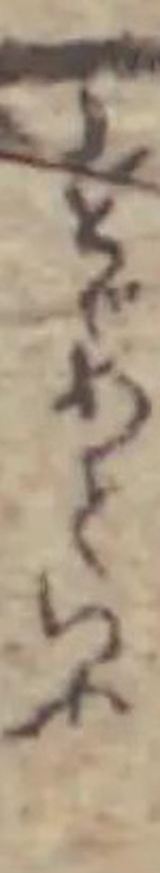すゞめといふ
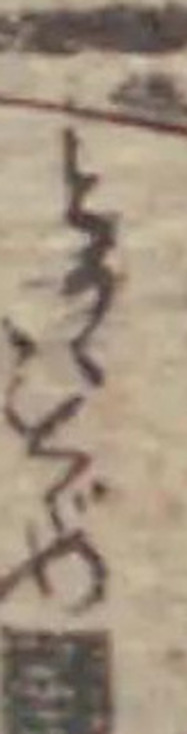とかくすゞめ
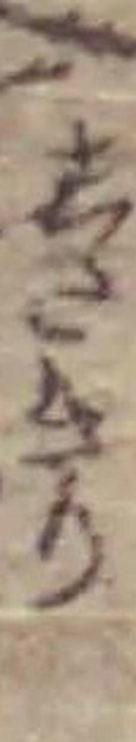したきり
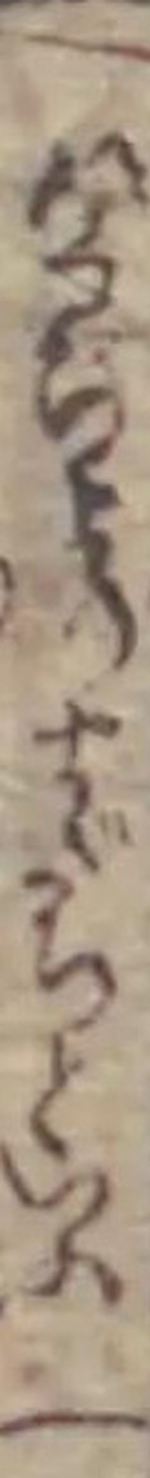はくちよりすだちといふ
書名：冷水灰毛猫 2巻
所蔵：国立国会図書館 National Diet Library, JAPAN
